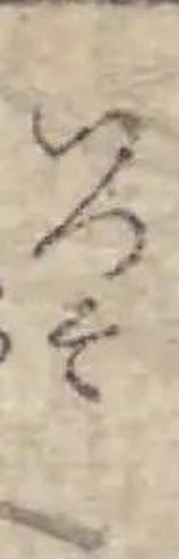いつそ
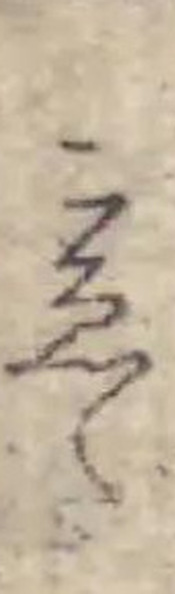こゑた
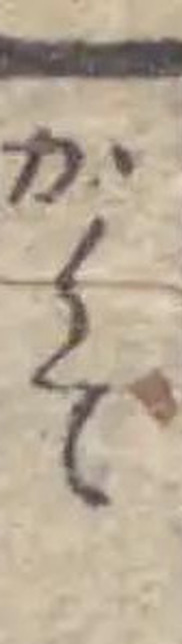かくて
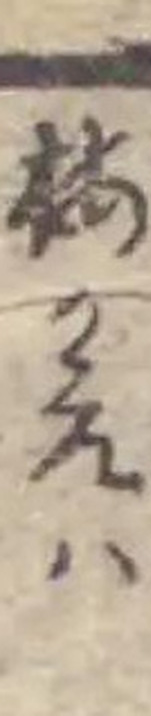梅かえは
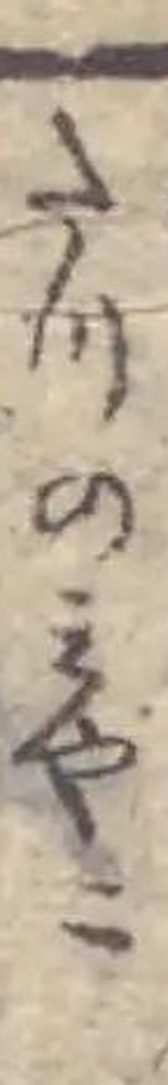たつのみやこ
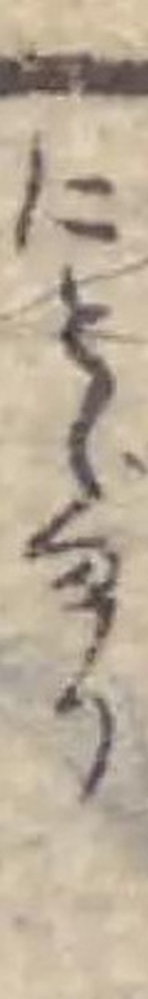にとゞまり
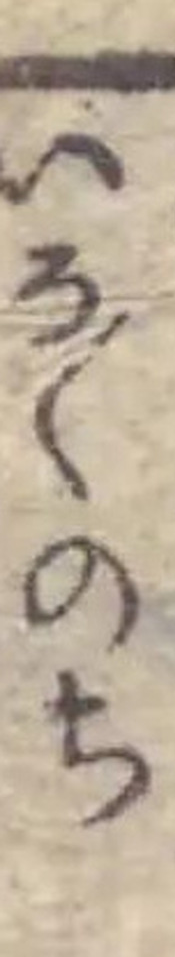いろ〳〵のち
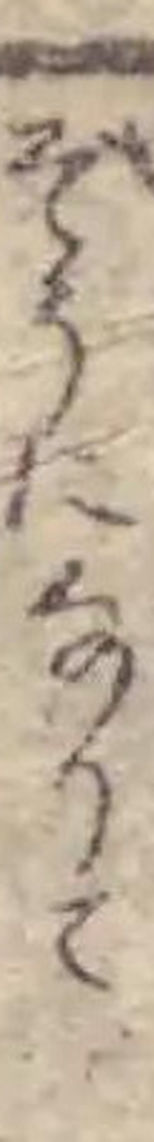そうになりて
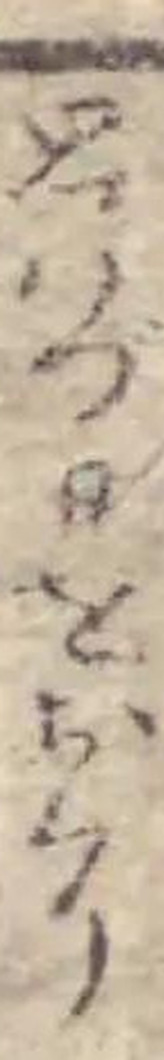思はづ日をおくり
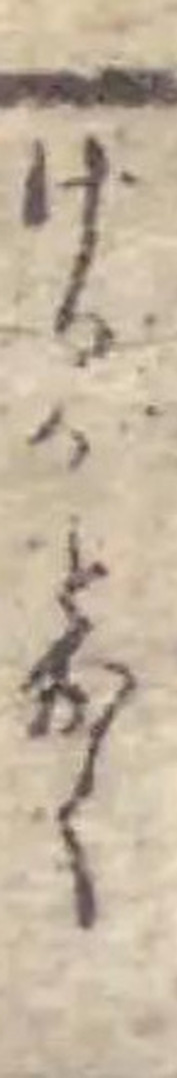けるがとおく
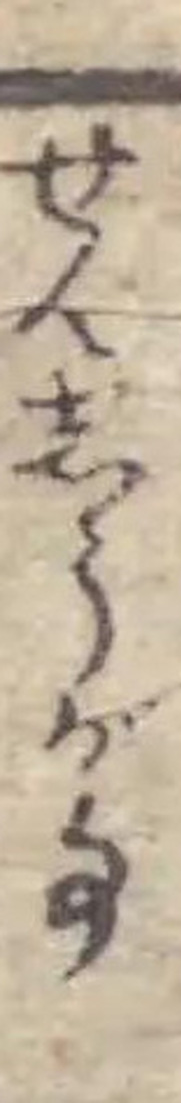せんしうが事
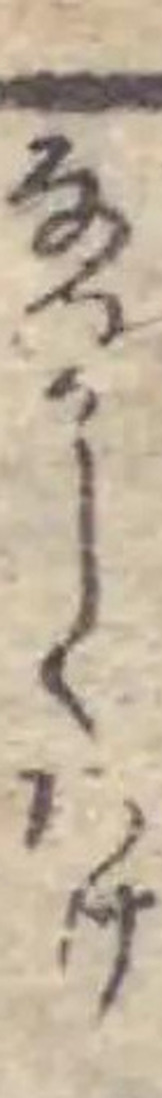なつかしくあけ
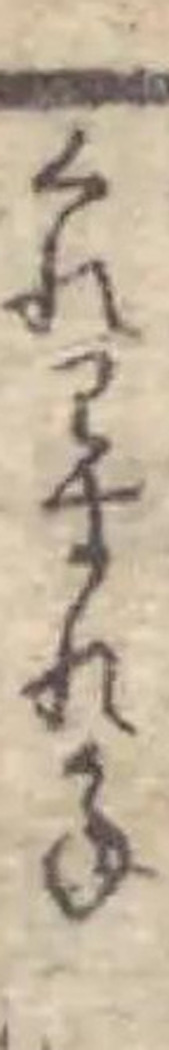くれわすれかね
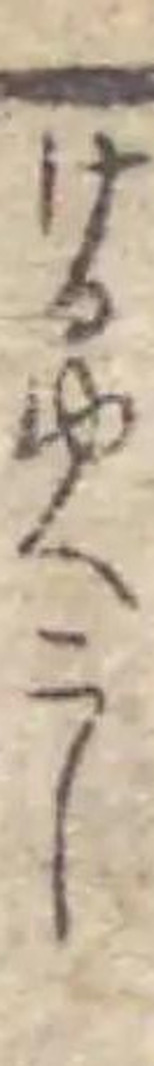けるゆへこし
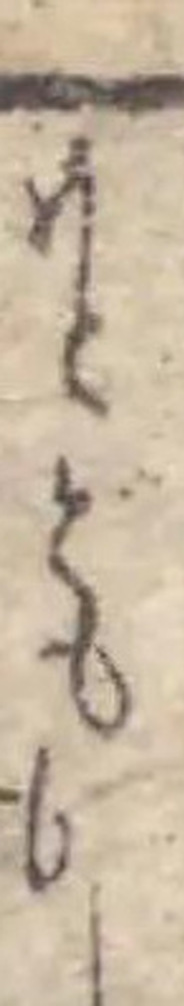もとともも
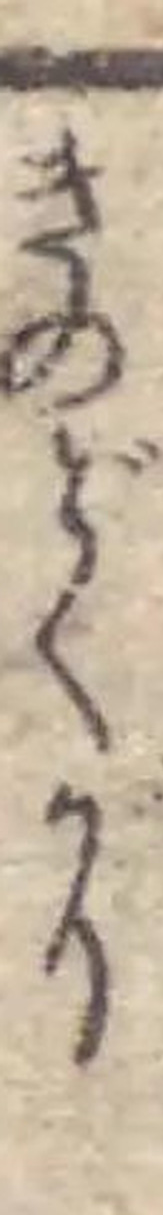きのどくがり
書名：見立蓬莱 : 2巻
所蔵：国立国会図書館 National Diet Library, JAPAN
